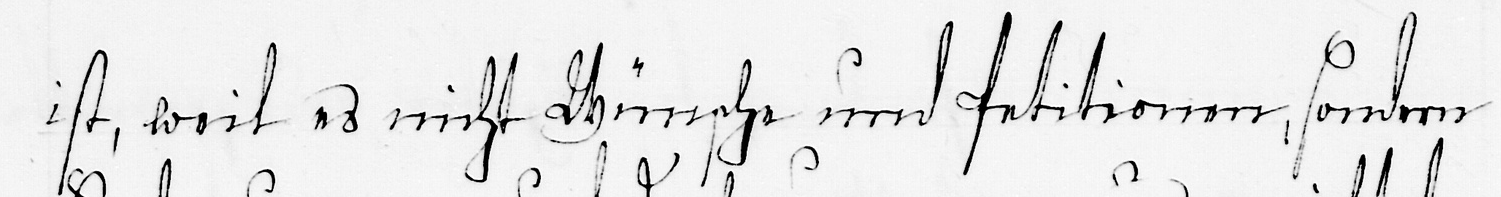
ist, weil es nicht Wünsche und Petitionen, sondern
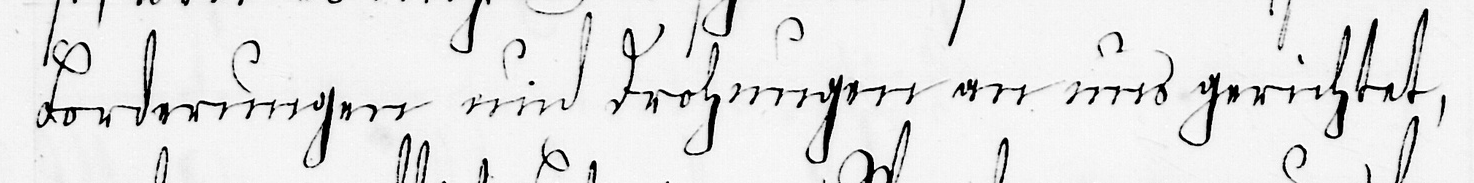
Forderungen und Drohungen an uns gerichtet,
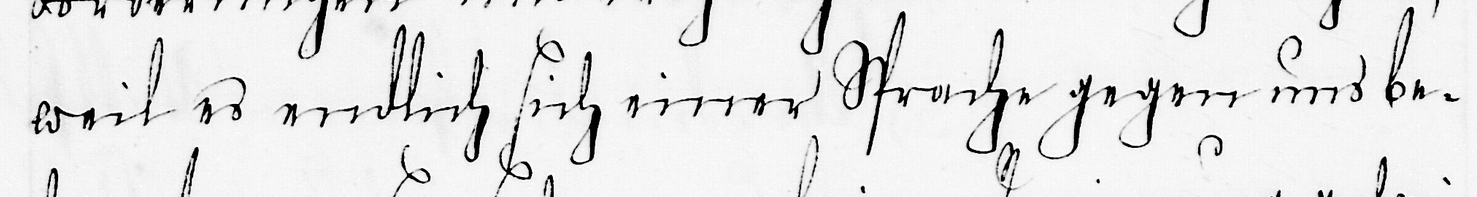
weil es endlich sich einer Sprache gegen uns be¬
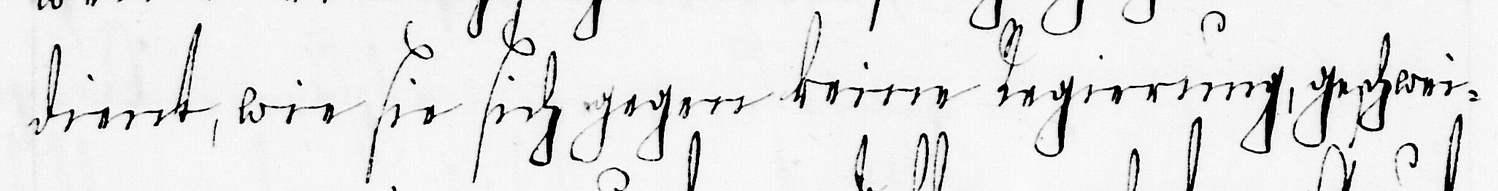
dient, wie sie sich gegen keine Regierung, geschwei¬
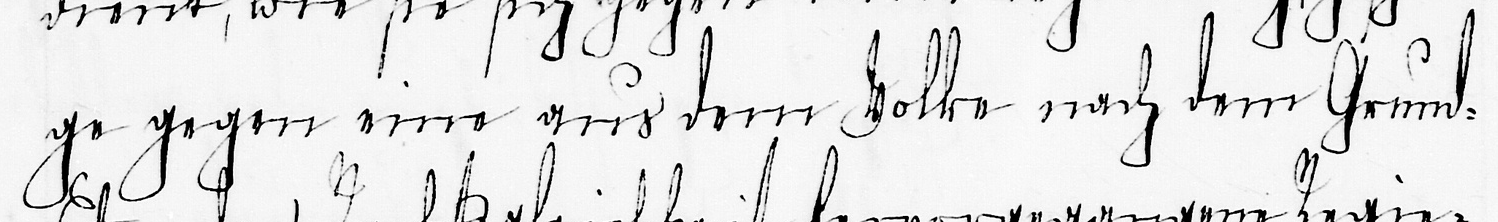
ge gegen eine aus dem Volke nach dem Grund¬
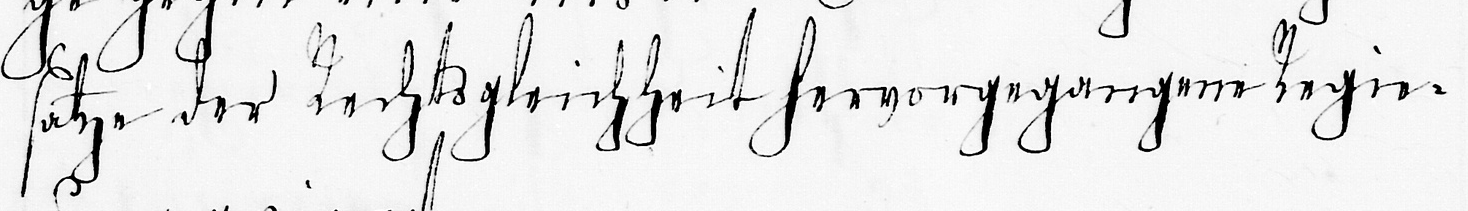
satze der Rechtsgleichheit hervorgegangene Regie¬
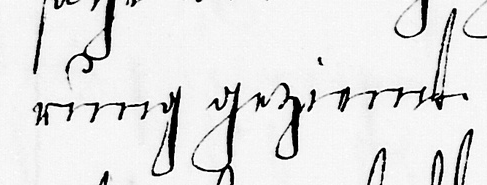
rung geziemt.
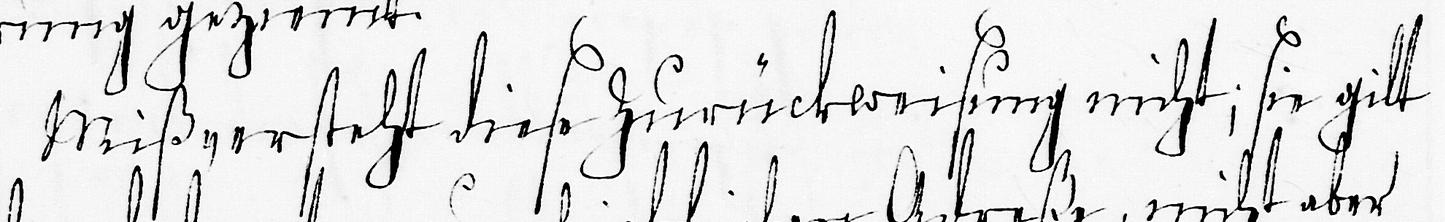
Mißversteht diese Zurückweisung nicht; sie gi¬
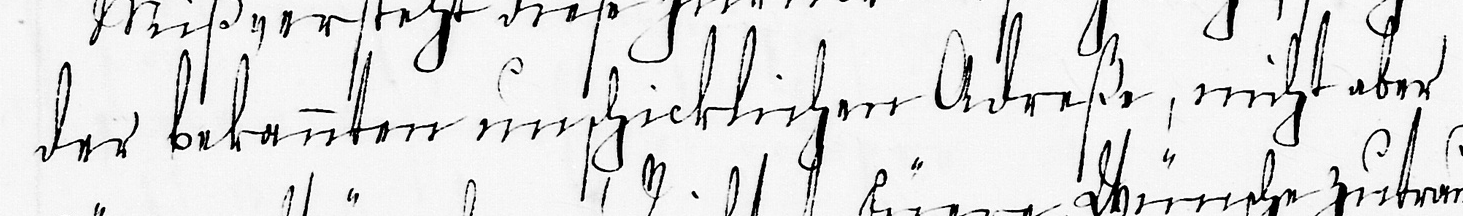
der bekannten unschicklichen Adreße, nicht aber
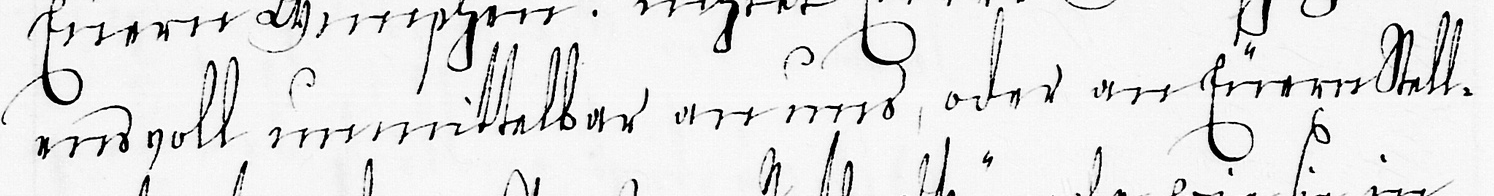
ensvoll unmittelbar an uns, oder an Euern Stell¬
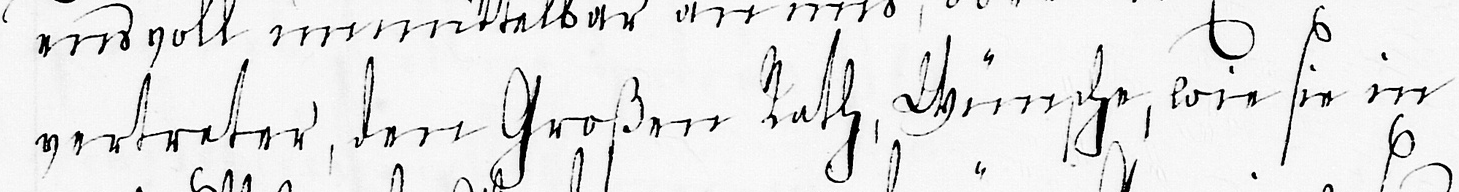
vertreter, den Großen Rath, Wünsche, wie sie in
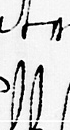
lt
